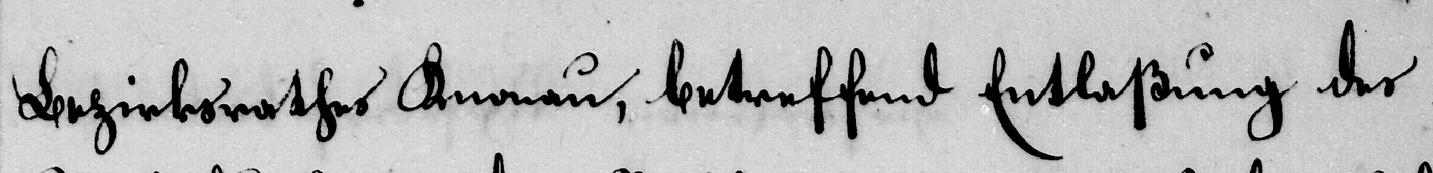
Bezirksrathes Knonau, betreffend Entlaßung des
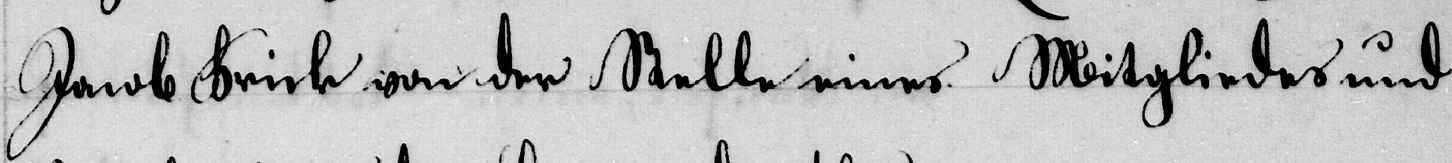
Jacob Frick von der Stelle eines Mitgliedes und
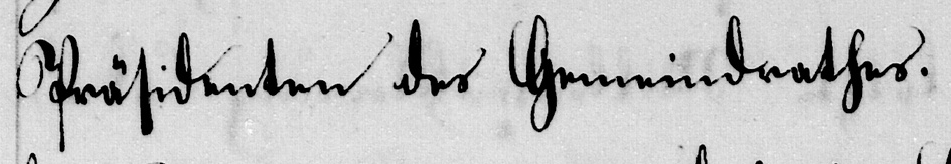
Präsidenten des Gemeindrathes.
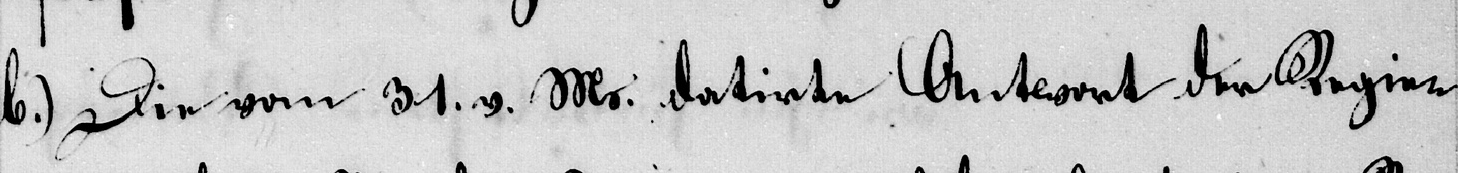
b.) Die vom 31. v. Ms. datirte Antwort der Regie¬
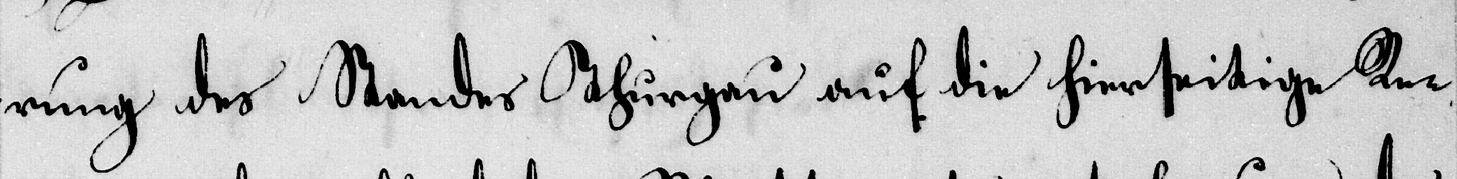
rung des Standes Thurgau auf die hierseitige Re¬
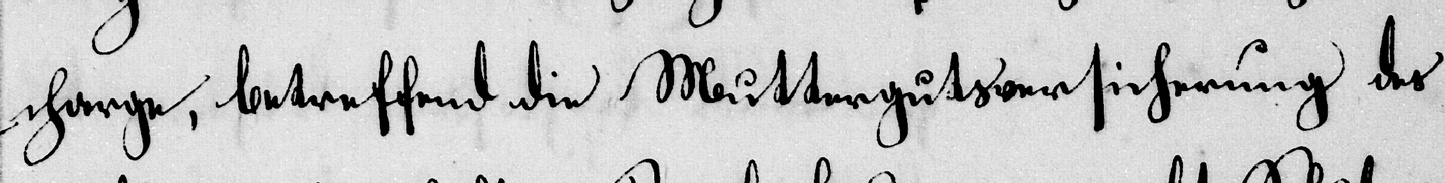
charge, betreffend die Muttergutsversicherung des
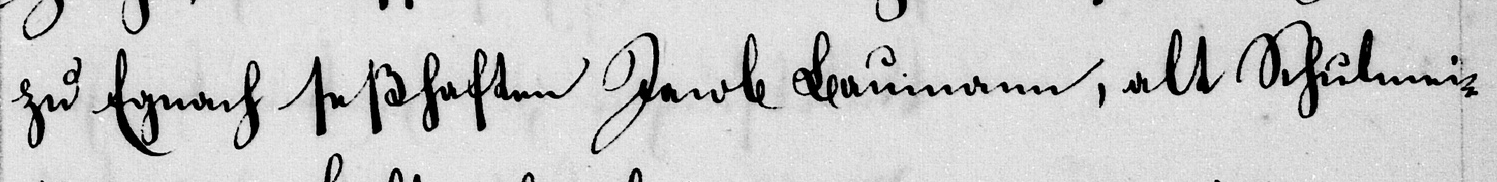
zu Egnach seßhaften Jacob Baumann, alt Schulmei¬
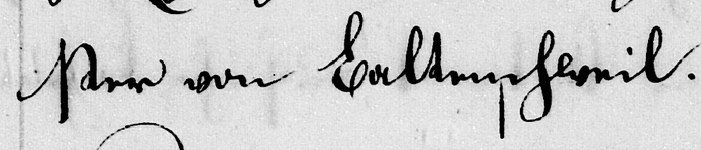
ster von Baltenschweil.
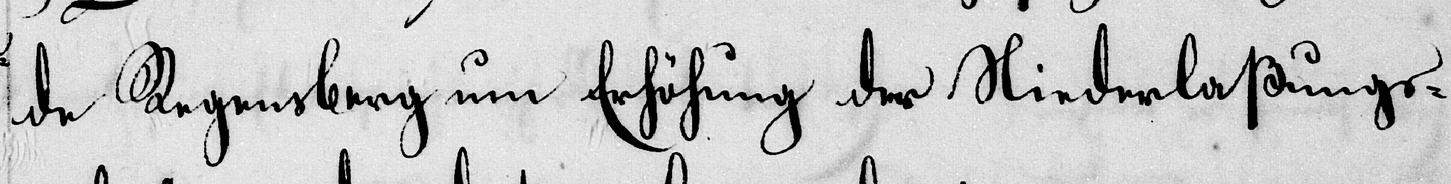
nde Regensberg um Erhöhung der Niederlaßungs¬
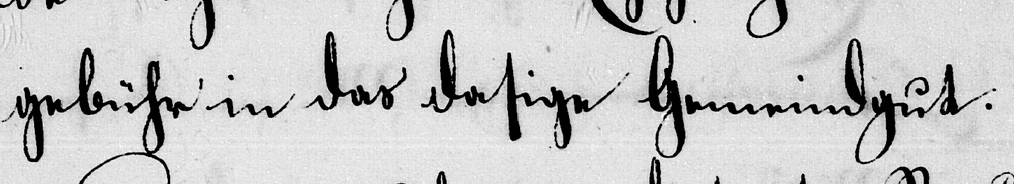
gebühr in das dasige Gemeindgut.
